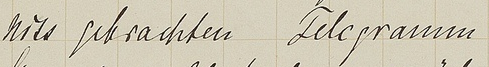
niss gebrachten Telegramm
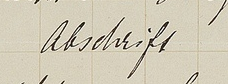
Abschrift
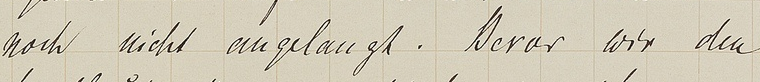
noch nicht angelangt. Bevor wir den
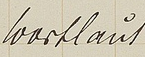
Wortlaut
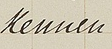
kennen
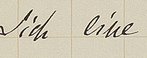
sich eine
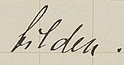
Meinung
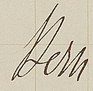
Bern
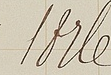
1876.
